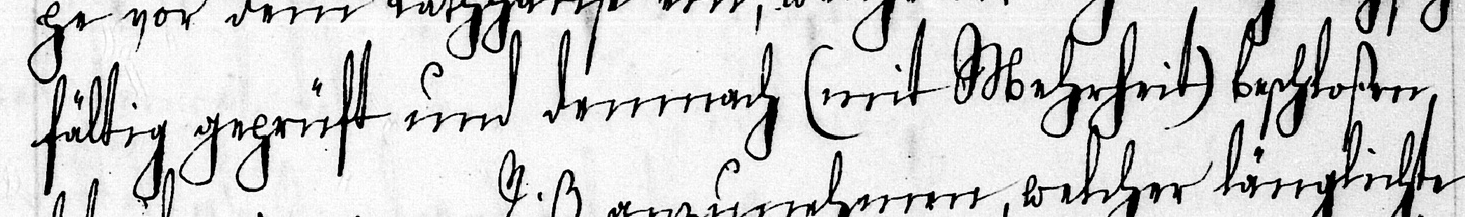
fältig geprüft und demnach (mit Mehrheit) beschloßen
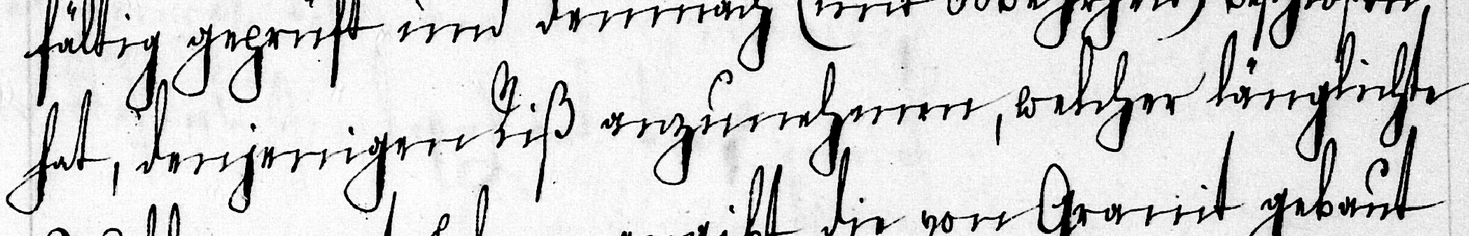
hat, denjenigen Riß anzunehmen, welcher länglichte
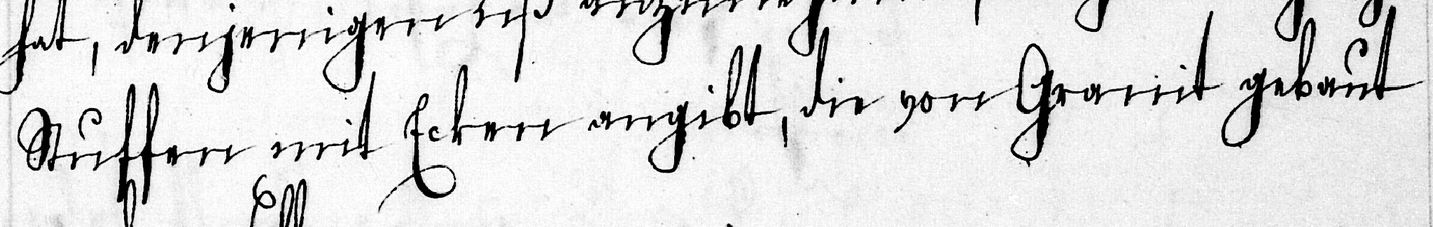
Stuffen mit Ecken angibt, die von Granit gebaut
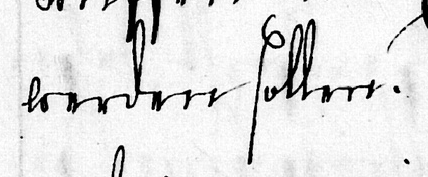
werden sollen.
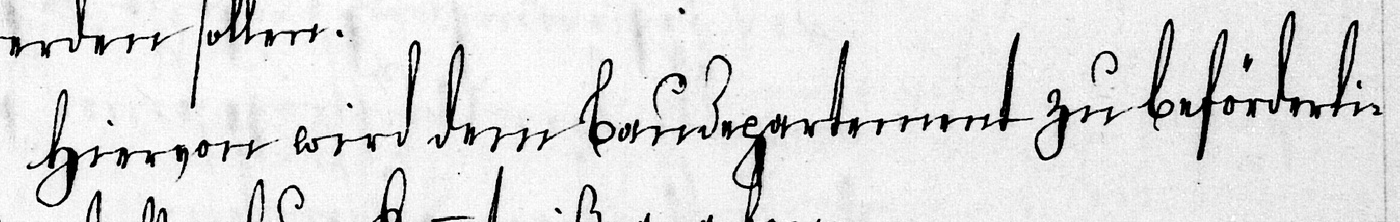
Hiervon wird dem Baudepartement zu beförderl¬
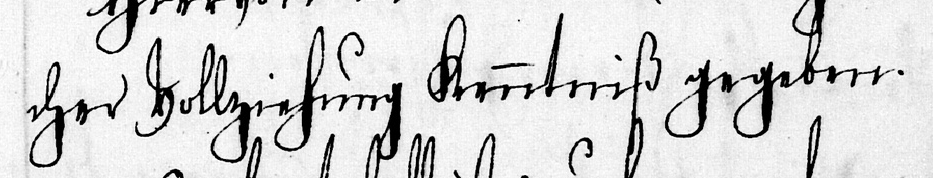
icher Vollziehung Kenntniß gegeben.
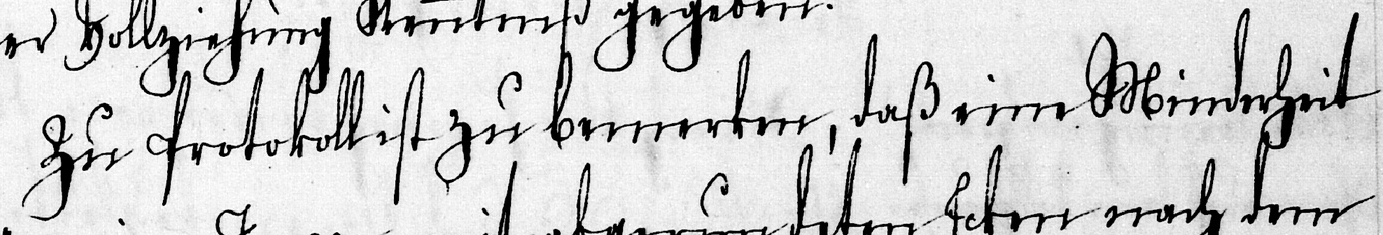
Zu Protokoll ist zu bemerken, daß eine Minderheit
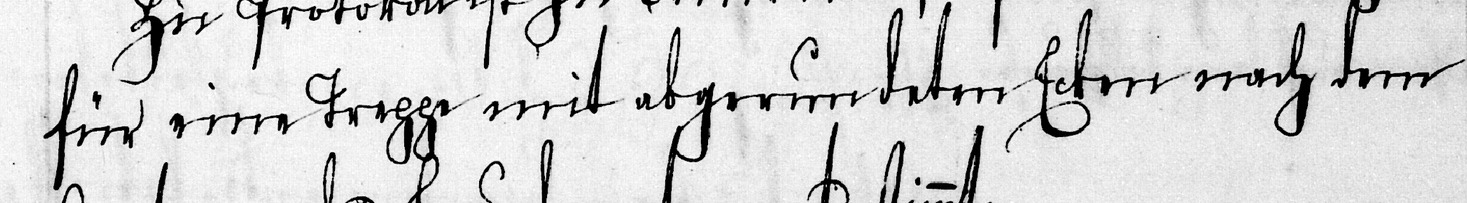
für eine Treppe mit abgerundeten Ecken nach dem
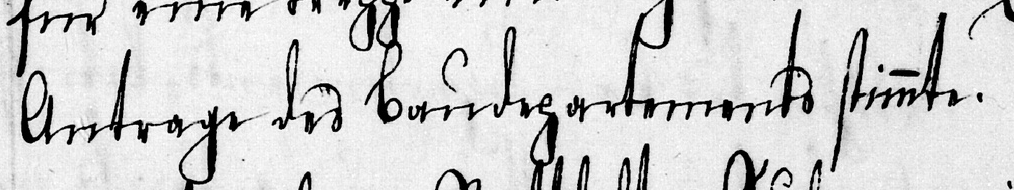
Antrage des Baudepartements stimmte.
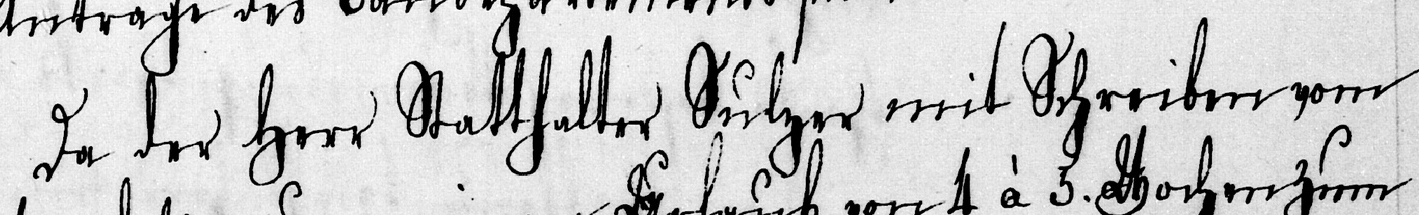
Da der Herr Statthalter Sulzer mit Schreiben vom
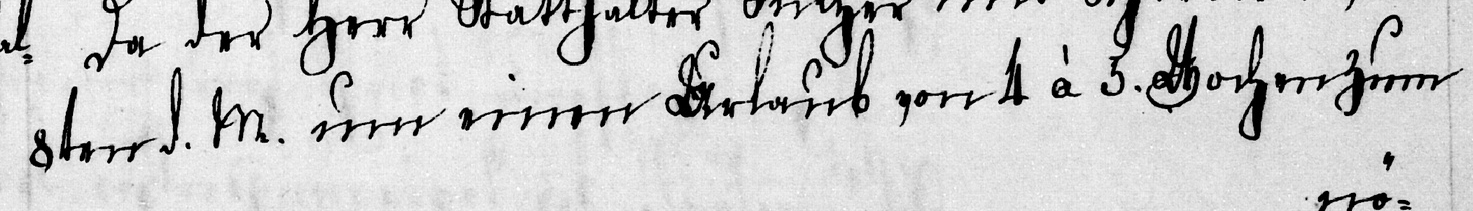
8ten d. M. um einen Urlaub von 4 à 5. Wochen zum
